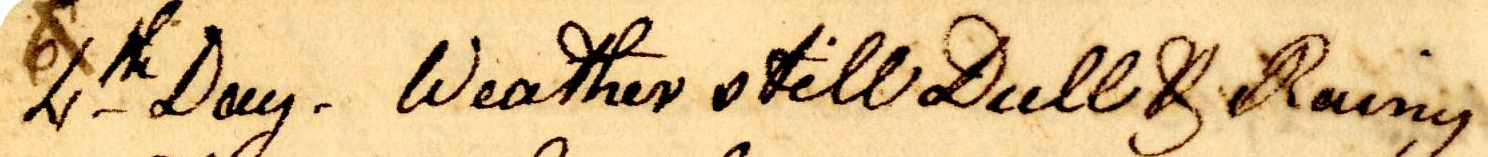4^th Day- Weather still Dull & Rainy
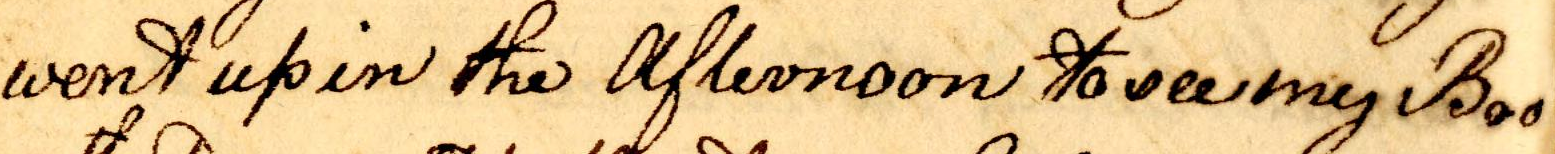went up in the Afternoon to see my Bro
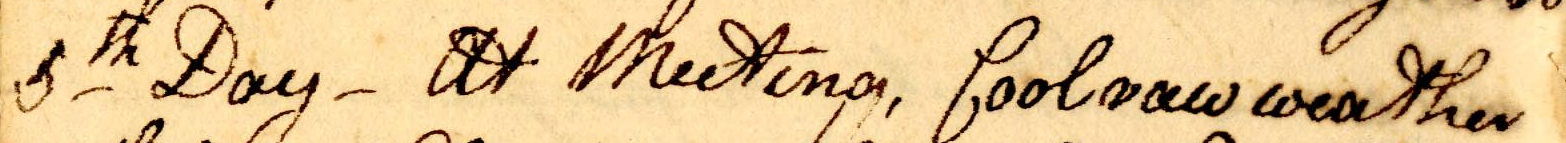5^th Day- At Meeting, Cool raw weather
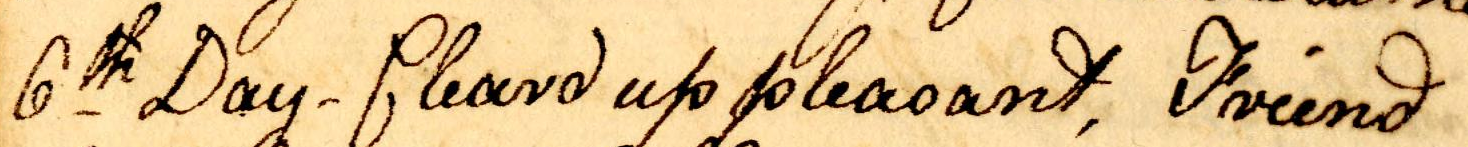6^th Day- Cleard up pleasant, Friend
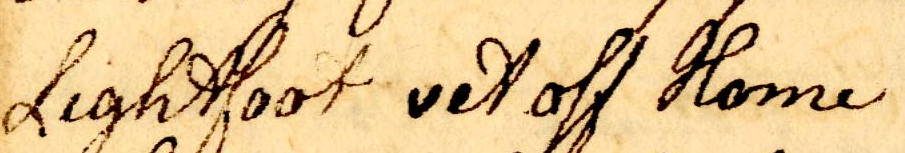Lightfoot set off Home
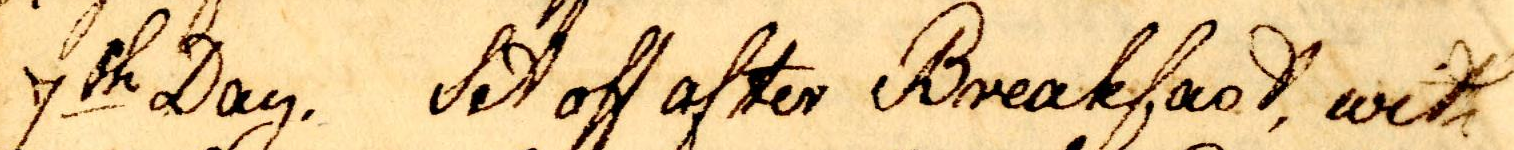7^th Day. Set off after Breakfast, with
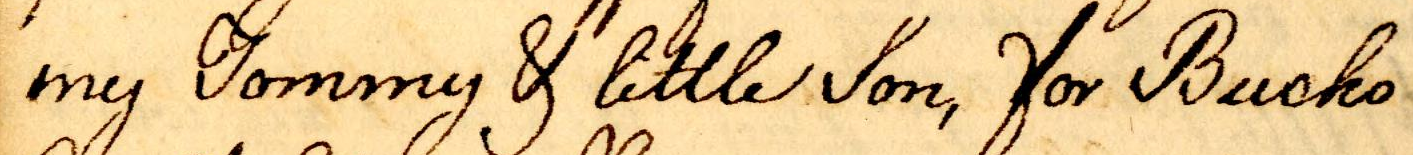my Tommy & little Son, for Bucks
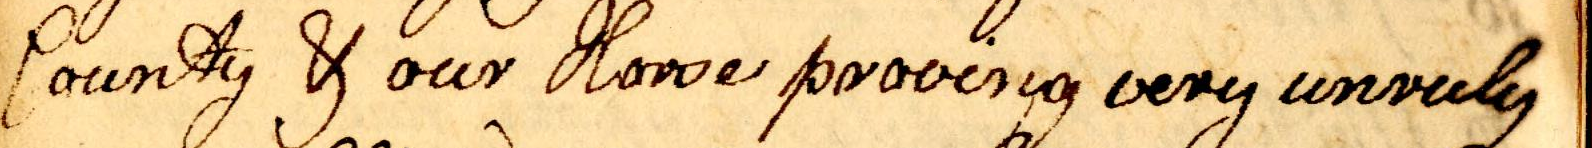County & our House proving very unruly
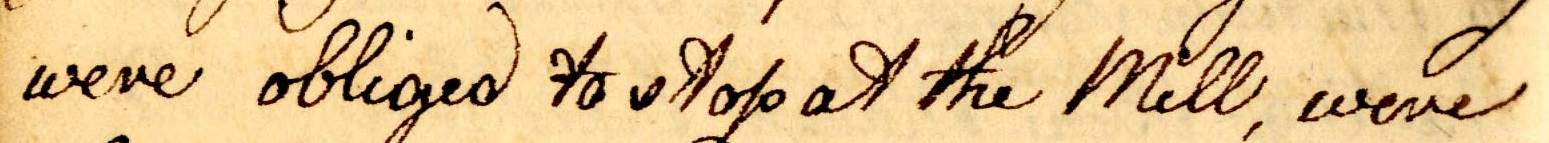were obliged to stop at the Mill, were
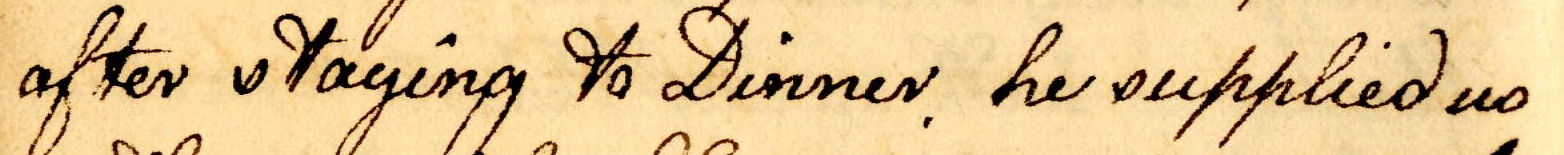after staying to Dinner, he supplied us
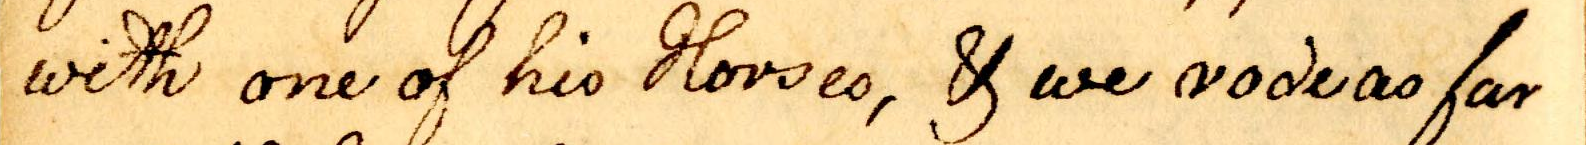with one of his Horses, & we rode as far
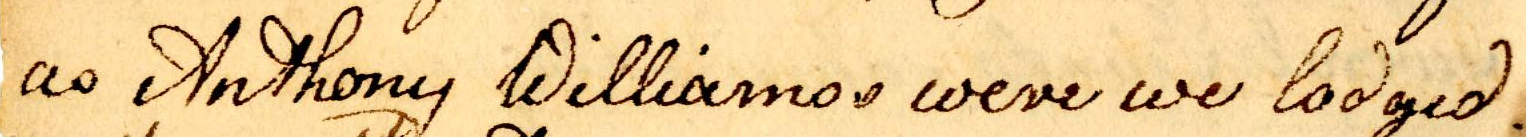as Anthony Williamss were we lodged.
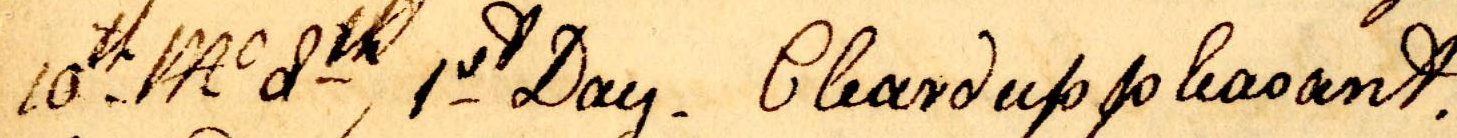10^th. M^o. 8^th- 1^st Day. Cleard up pleasant.
